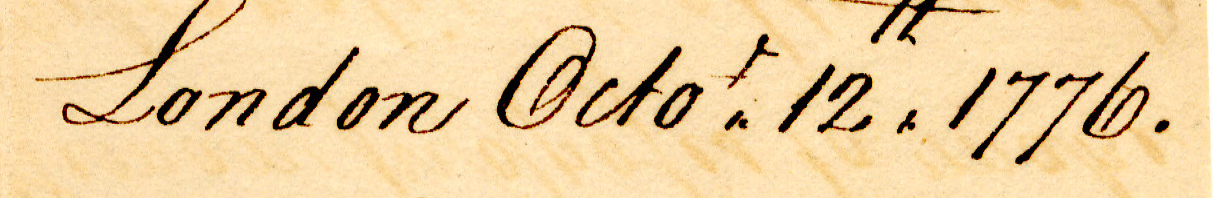London Octo^r. 12^th. 1776.
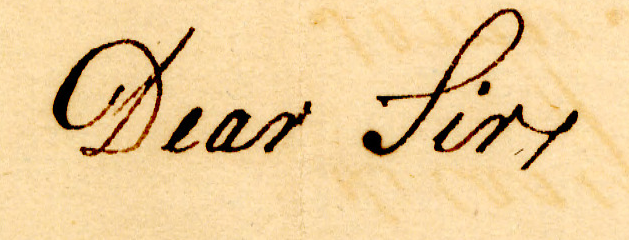Dear Sir
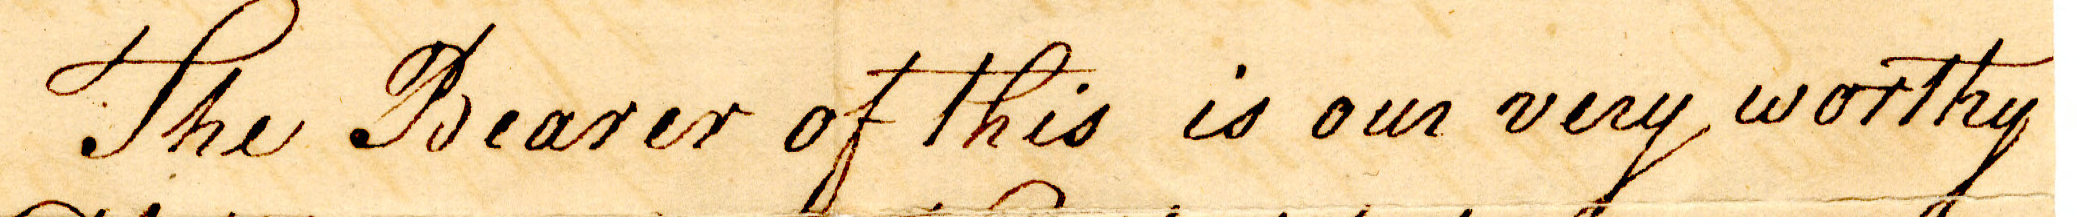The Bearer of this is our very worthy
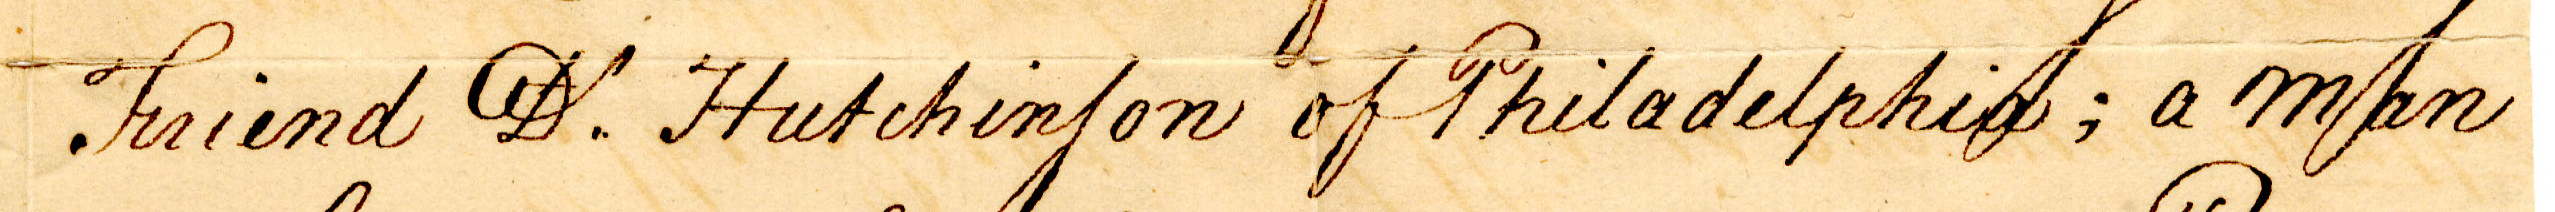Friend D^r. Hutchinson of Philadelphia; a man
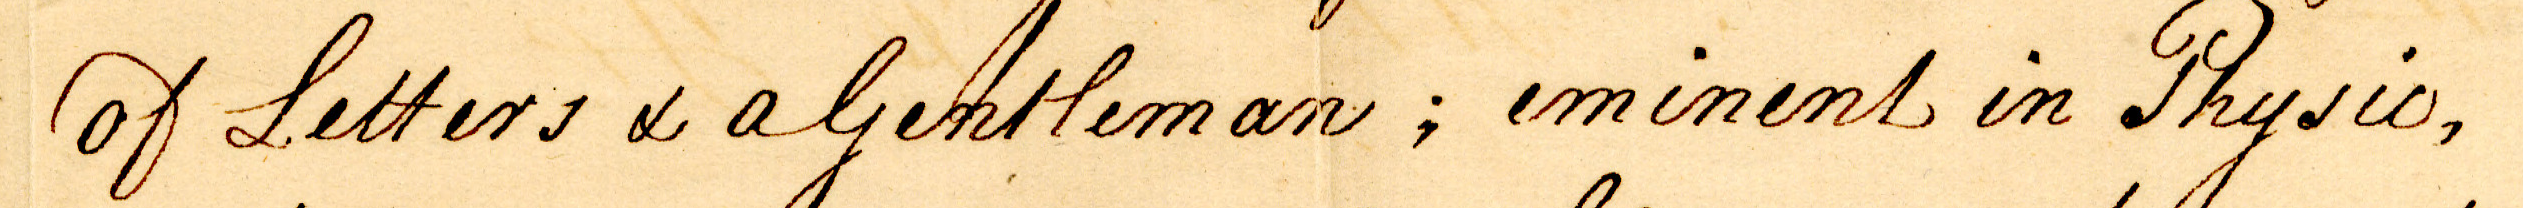of Letters & a Gentleman; eminent in Physic,
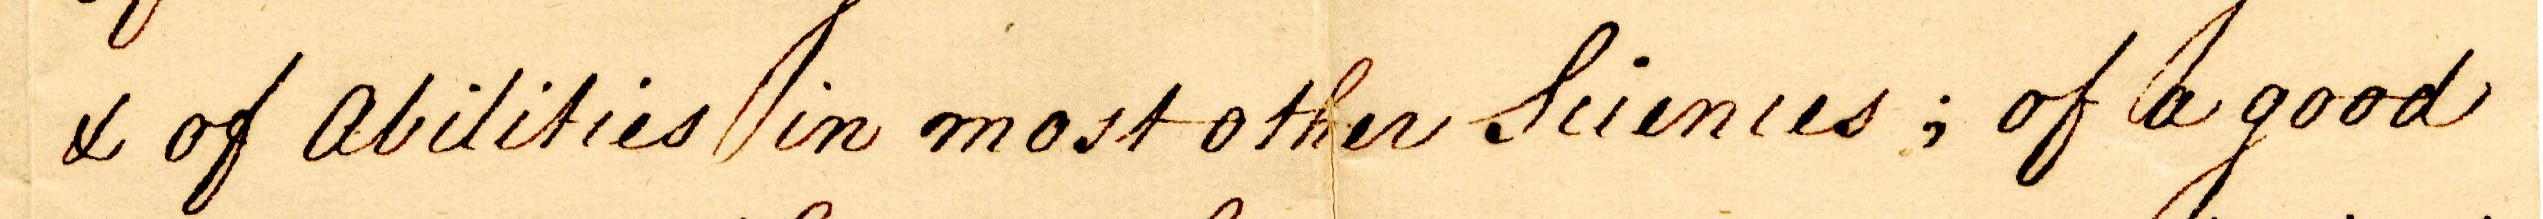& of Abilities in most other Sciences; of a good
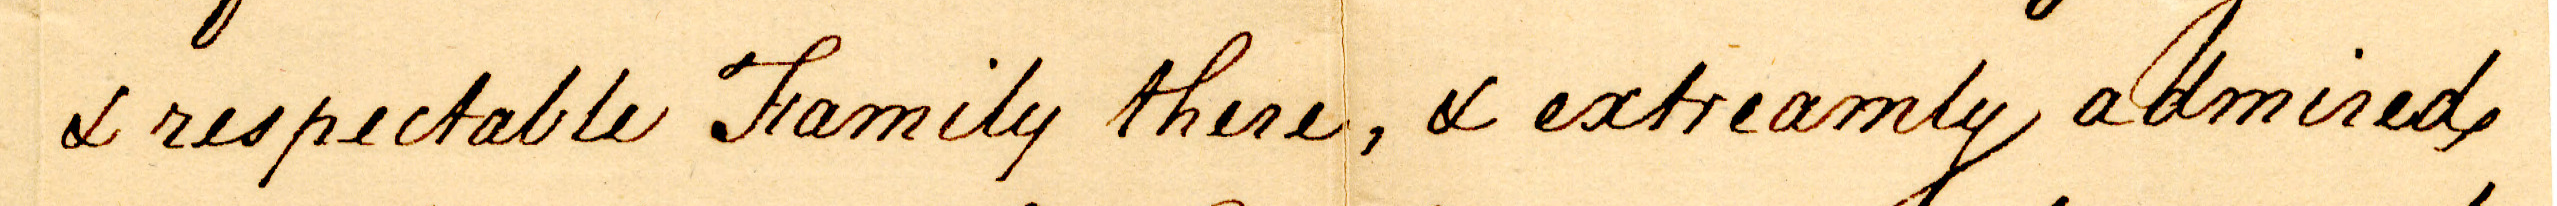& respectable Family there, & extreamly admired,
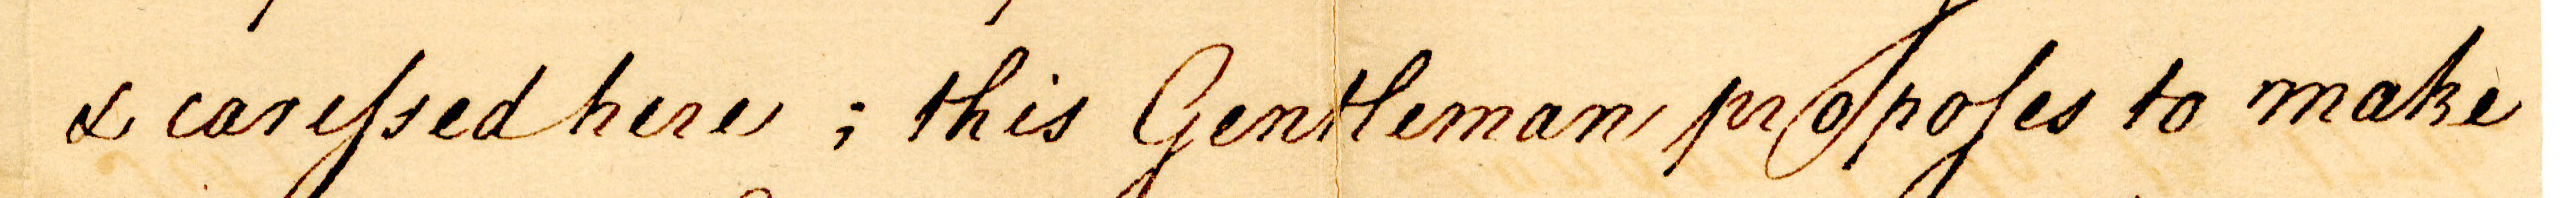& caressed here; this Gentleman proposes to make
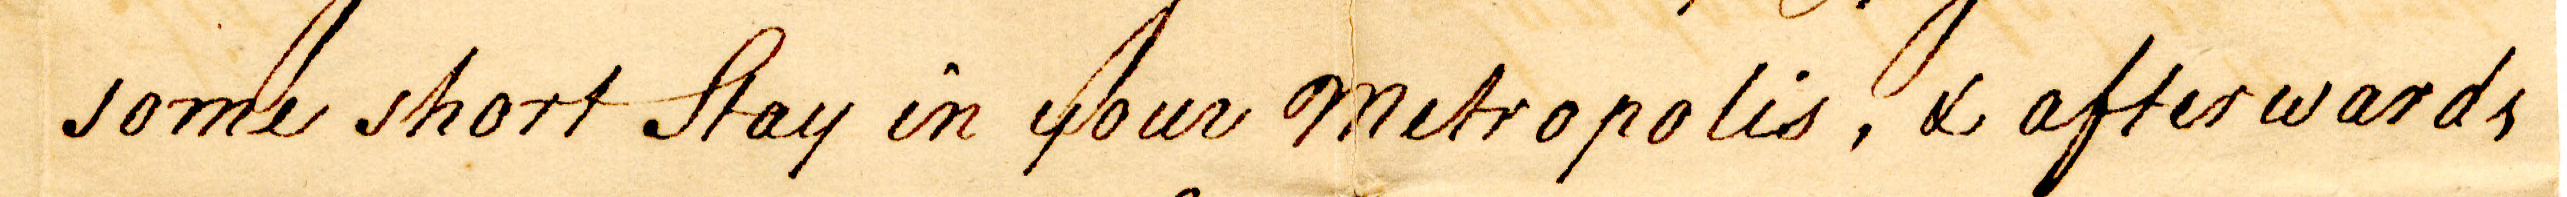some short Stay in your metropolis, & afterwards
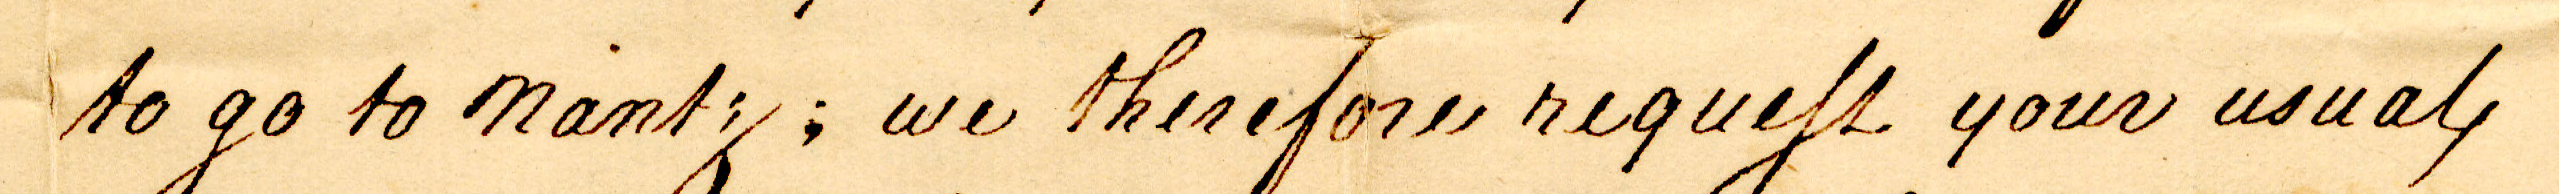to go to Nantz; we therefore request your usual
